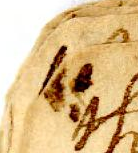20
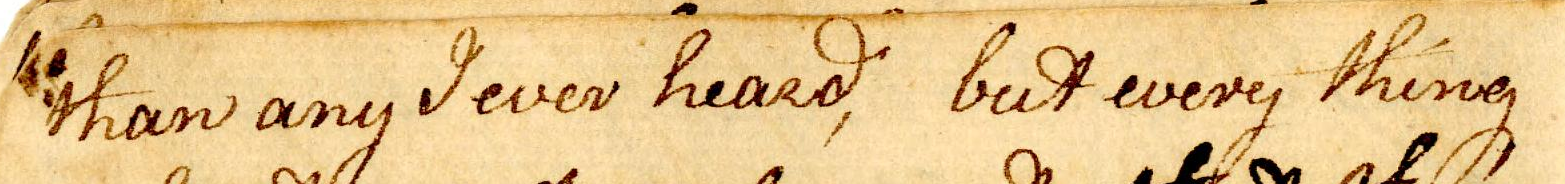than any I ever heard, but every thing
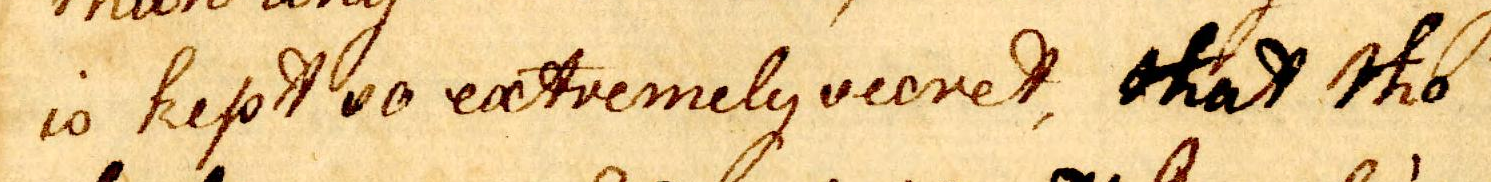is kept so extremely secret, that tho
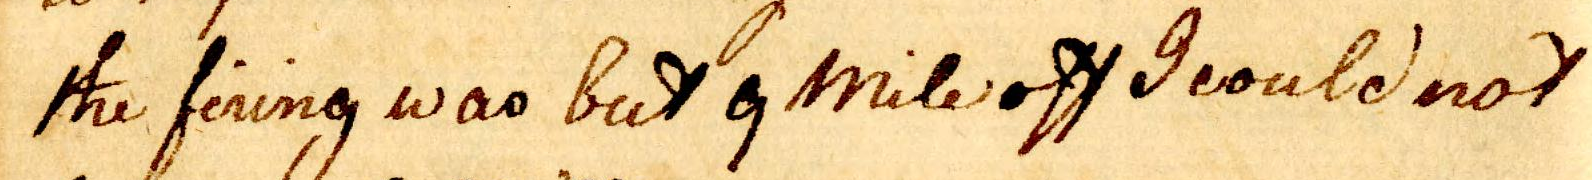the firing was but 9 mile off I could not
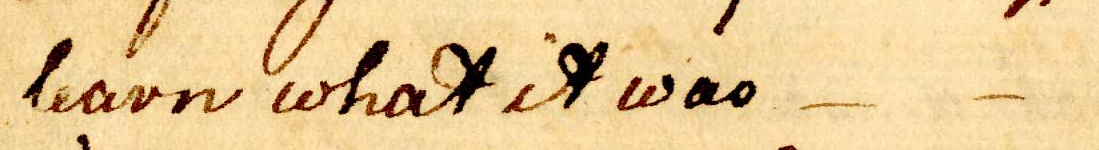learn what it was-
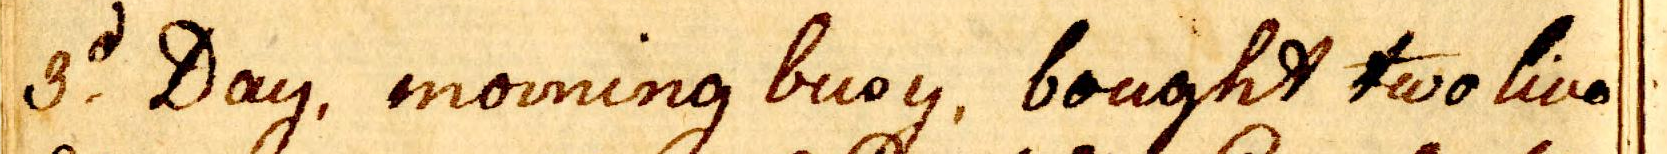3^d Day. morning busy, bought two live
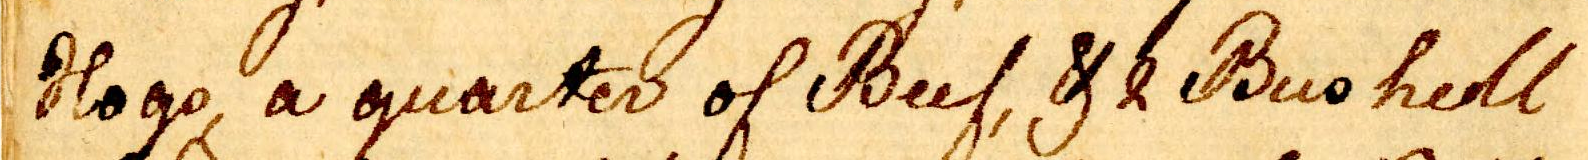Hogs, a quarter of Beef, & 2 Bushell
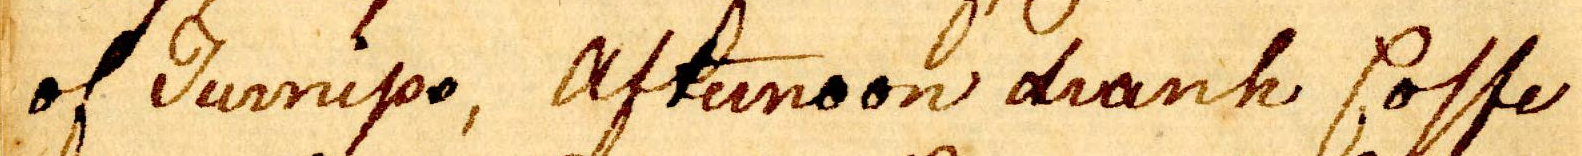of Turnips, Afternoon drank Coffe
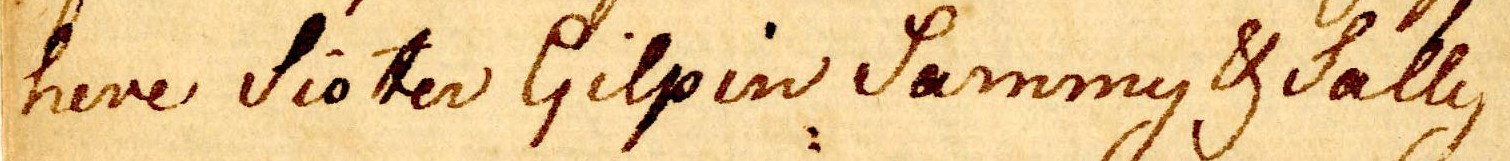here Sister Gilpin Sammy & Sally
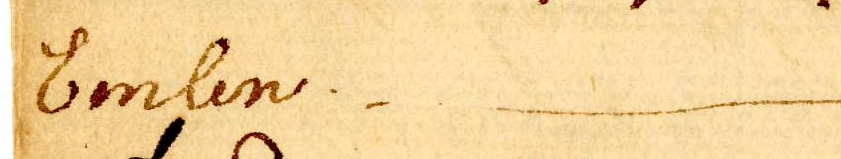Emlen--
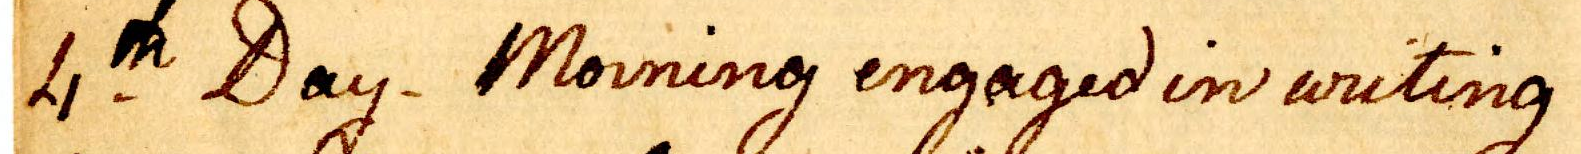4^th Day- Morning engaged in writing
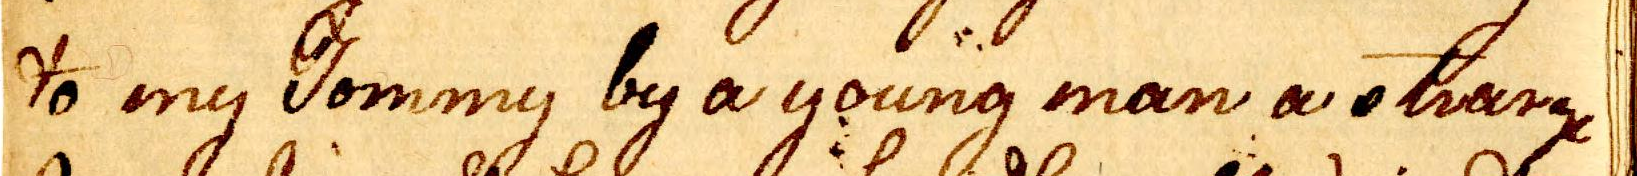to my Tommy by a young man a strange
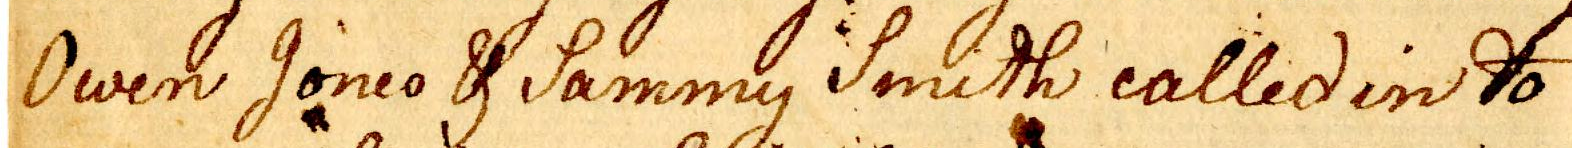Owen Jones & Sammy Smith called in to
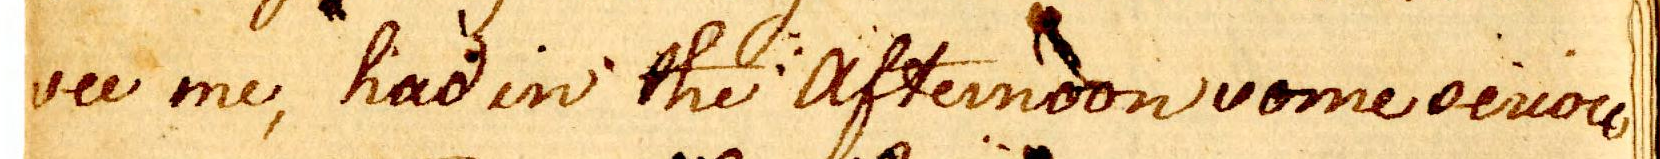see me, had in the Afternoon some seriou
